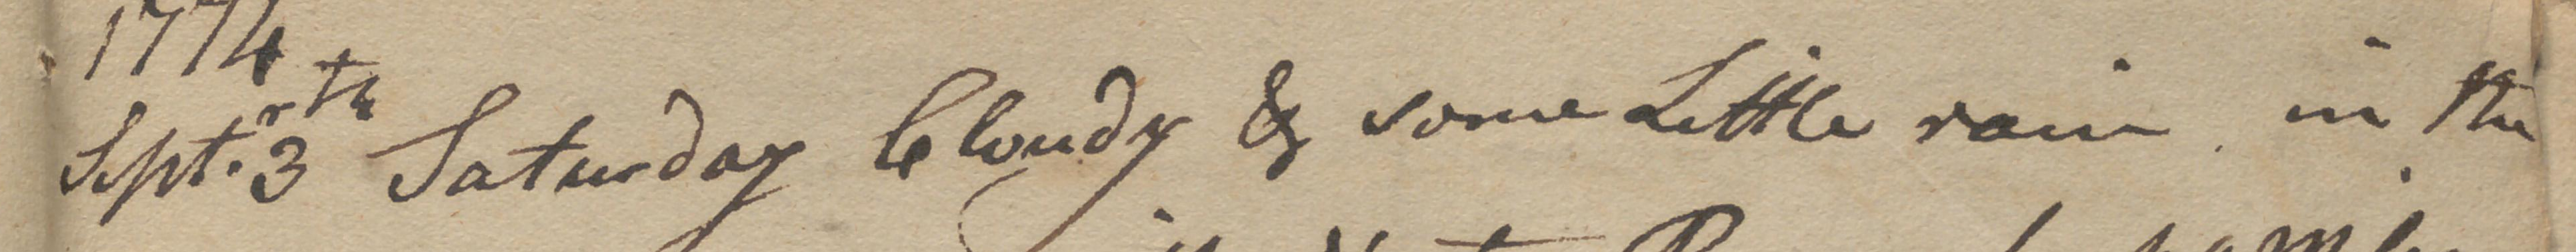Sept^r. 3^th Saturday Cloudy & some Little rain, in the
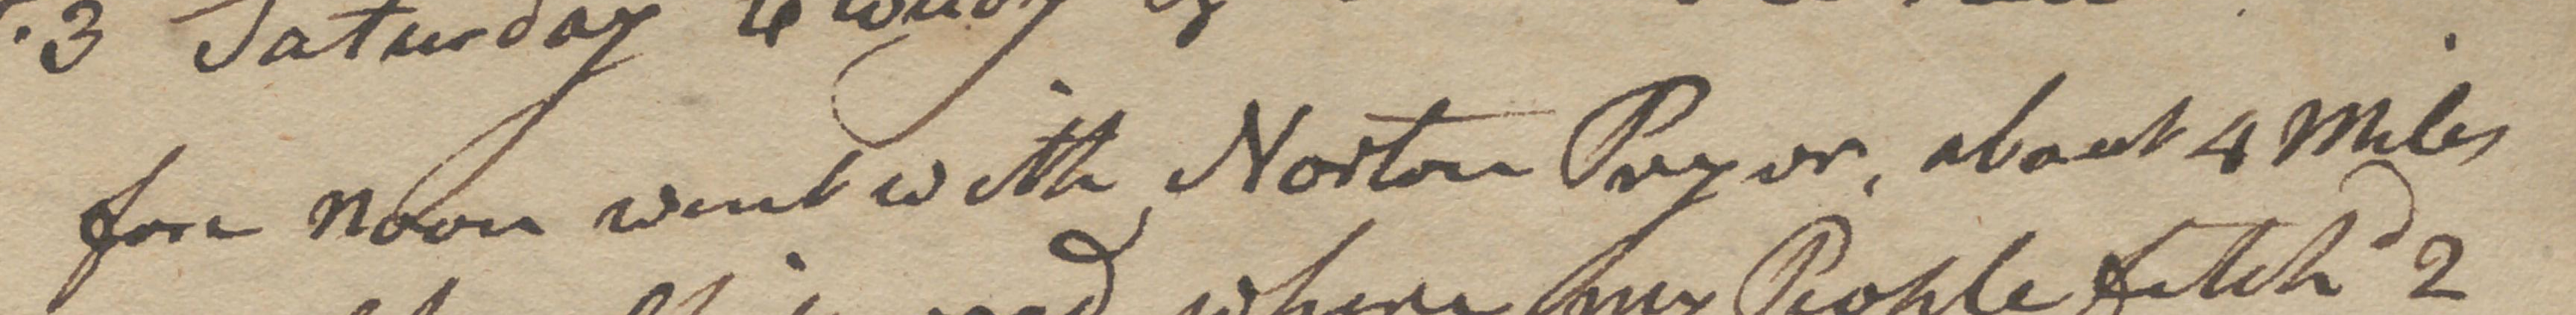fore noon went with Norton Pryor, about 4 Miles
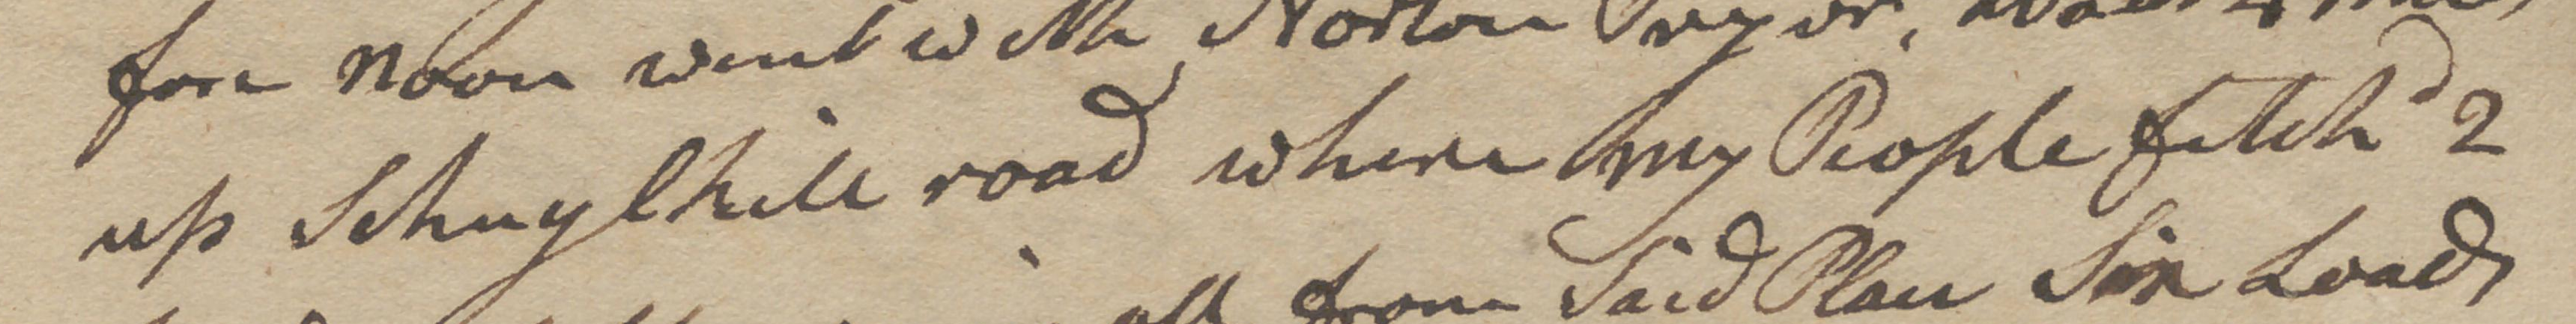up Schuylkill road where any People fetch^d 2
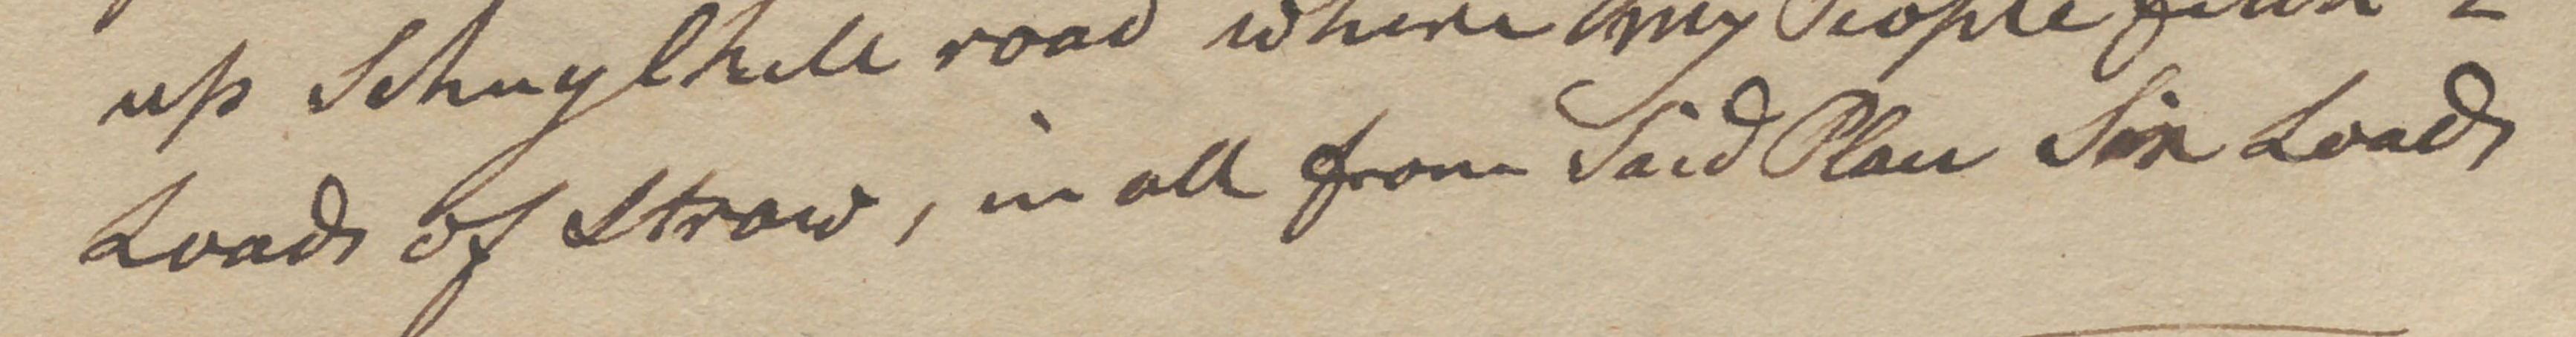Loads of Straw, in all from Said Place Six Loads
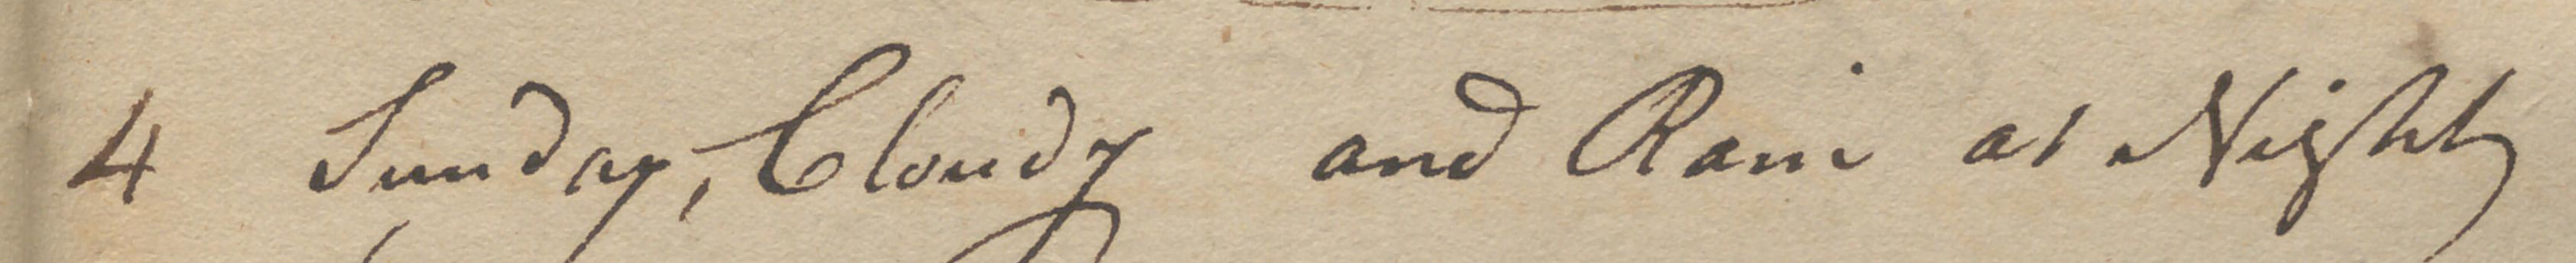4 Sunday, Cloudy and Rain at Night
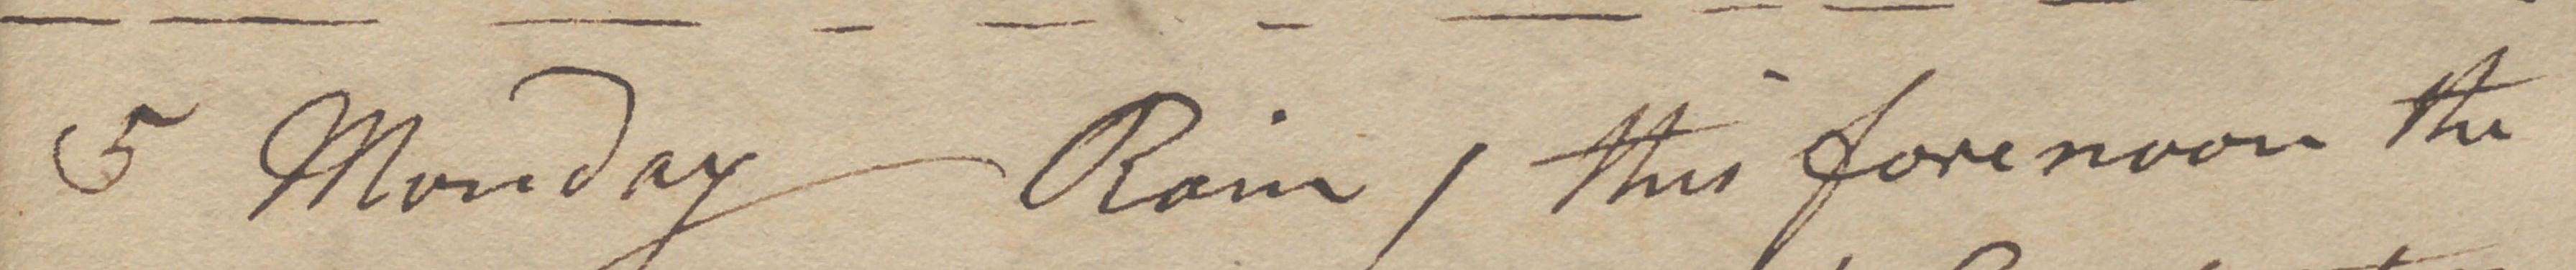5 Monday Rain / this forenoon the
